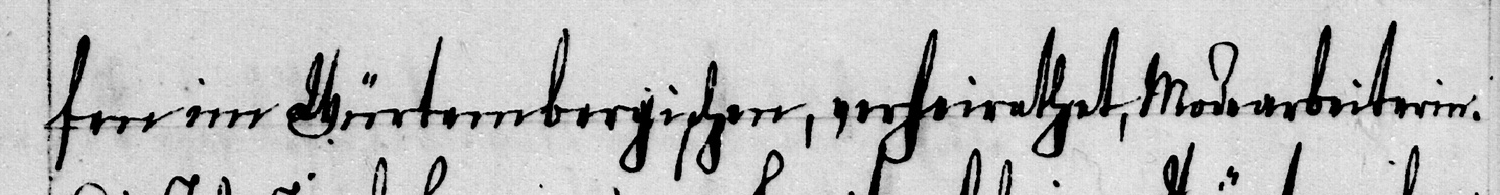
fen im Würtembergischen, verheirathet, Modearbeiterin.
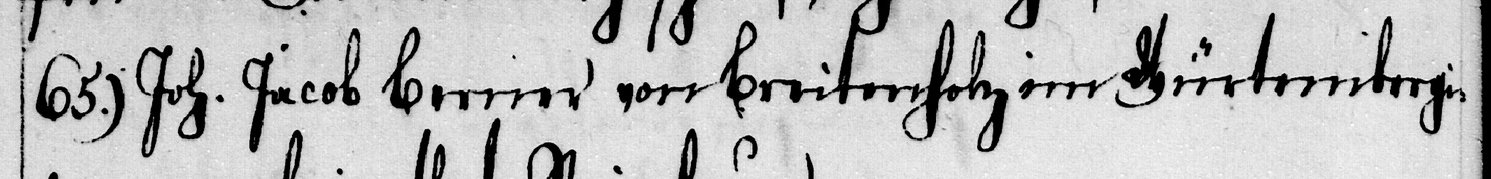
65.) Joh. Jacob Berner von Breitenholz im Würtembergi¬
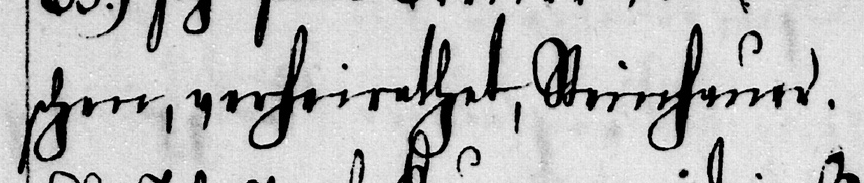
schen, verheirathet, Steinhauer.
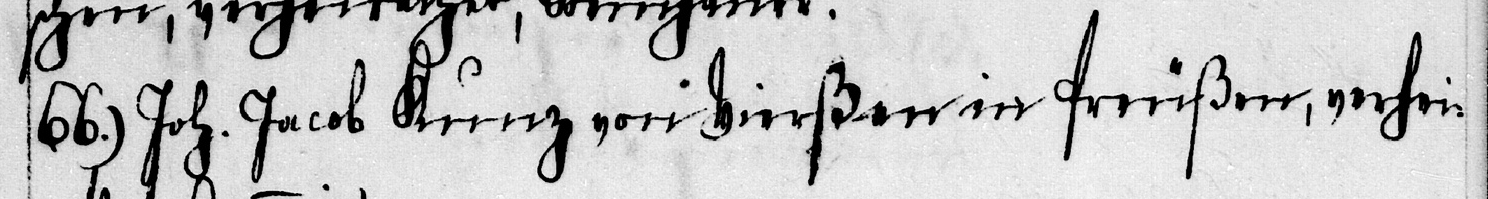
66.) Joh. Jacob Kunz von Vierßen in Preußen, verhei¬
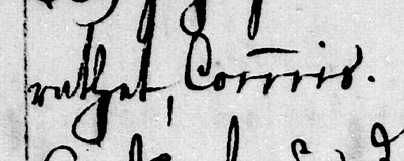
rathet, Commis.
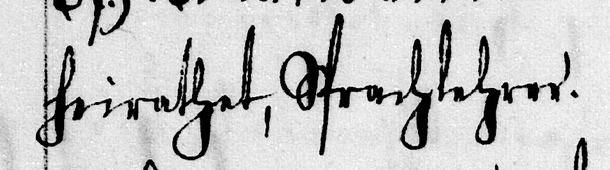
heirathet, Sprachlehrer.
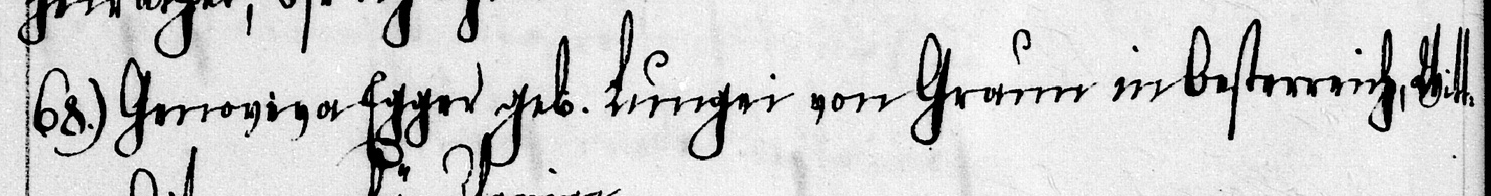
68.) Genoviva Egger geb. Lungei von Graun in Oesterreich, Wi¬
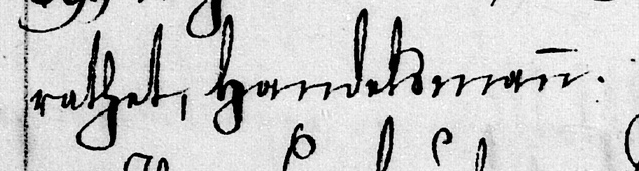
rathet, Handelsmann.
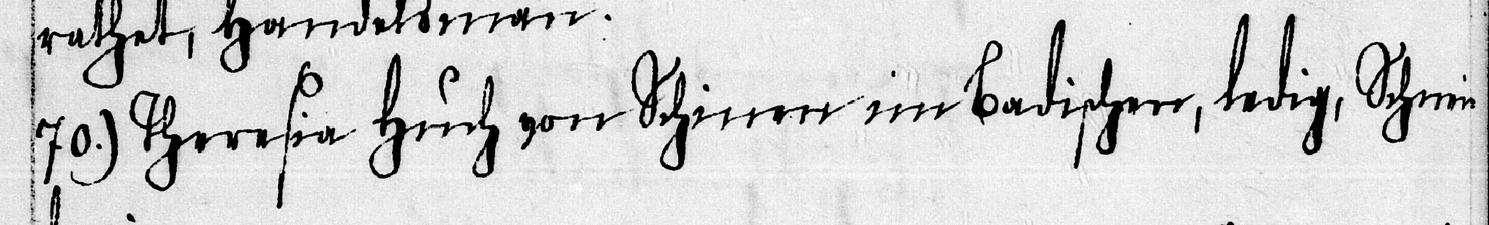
70.) Theresia Huch von Schinen im Badischen, ledig, Schne¬
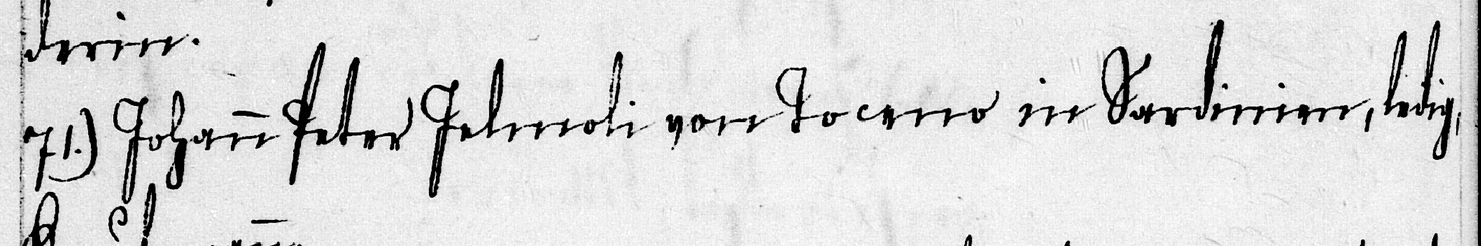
71.) Johann Peter Jelmoli von Toceno in Sardinien, ledi¬
